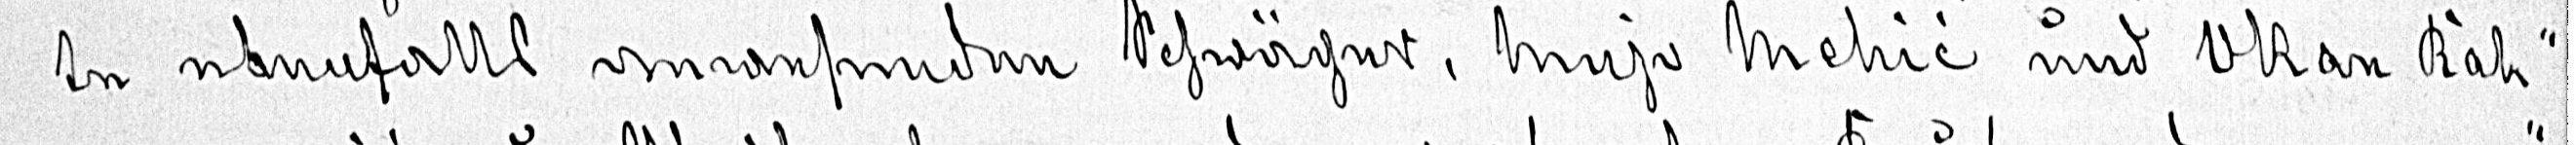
te ebenfalls anwesenden Schwäger, Mujo Mehić und Okan Rab¬
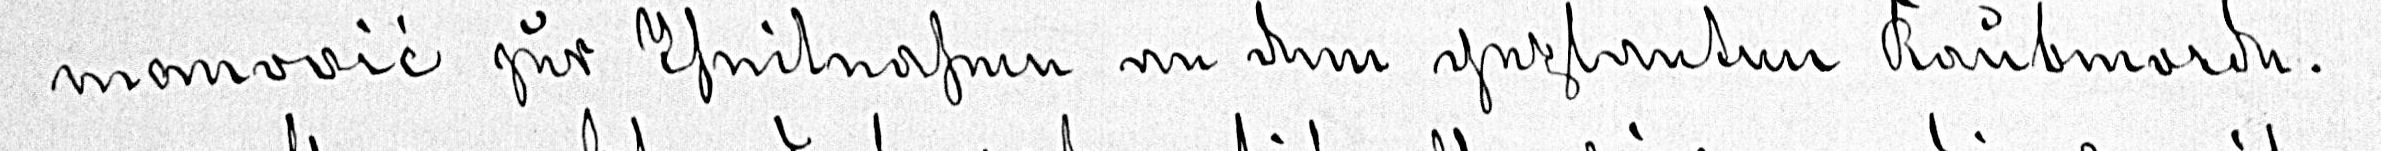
momović zur Theilnahme an dem geplanten Raubmorde.
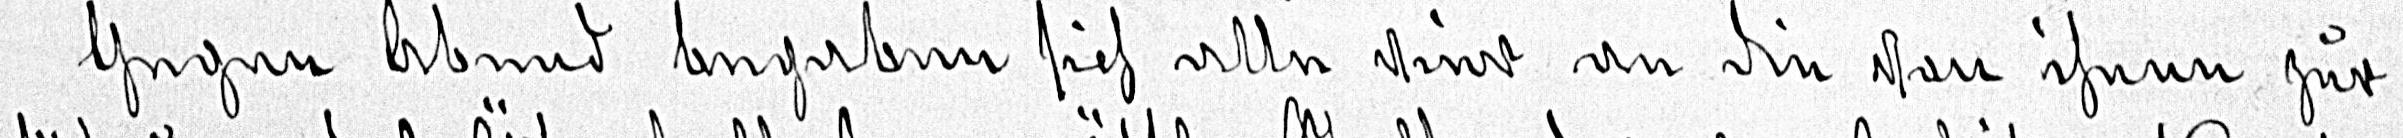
Gegen Abend begeben sich alle vier an die von ihnen zur
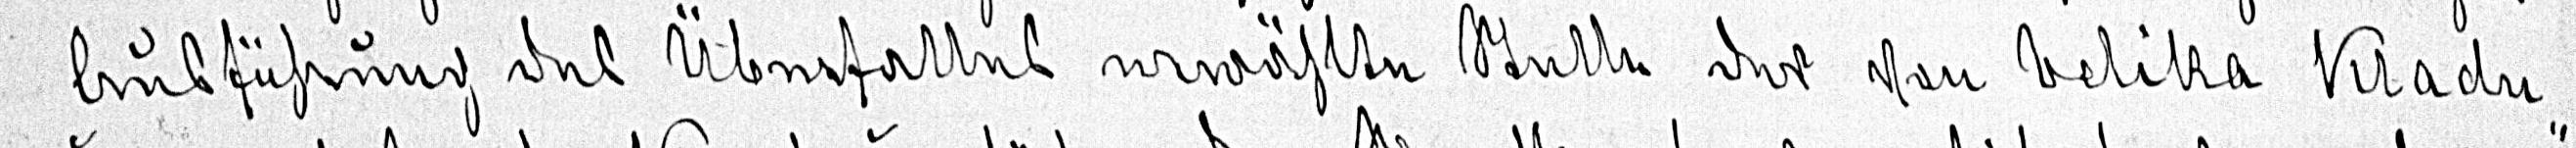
Ausführung des Überfalles erwählte Stelle der von Velika Kladu¬
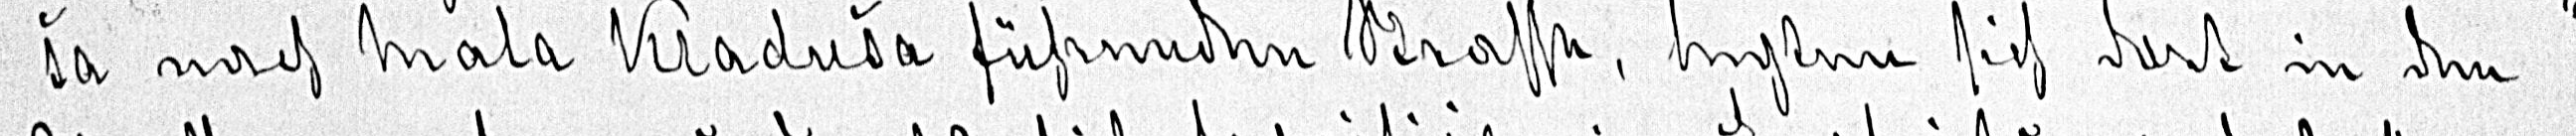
ša nach Mala Kladuša führenden Strasse, legten sich dort in den
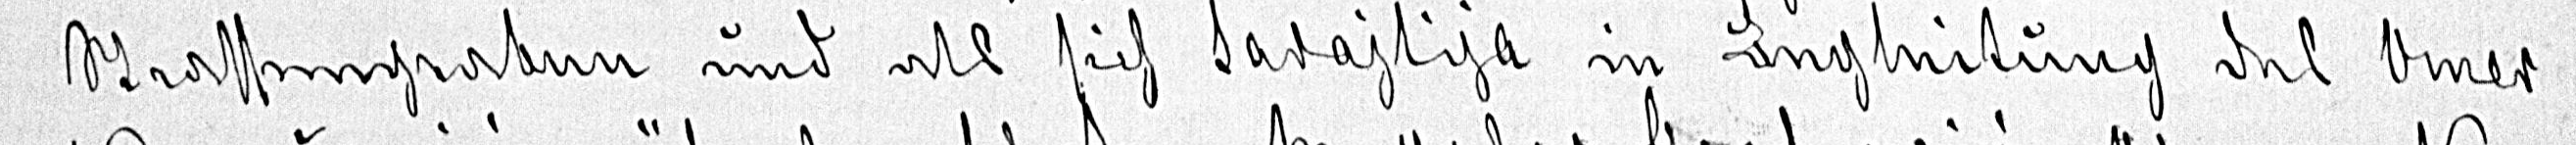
Strassengraben und als sich Savajlija in Begleitung des Omer
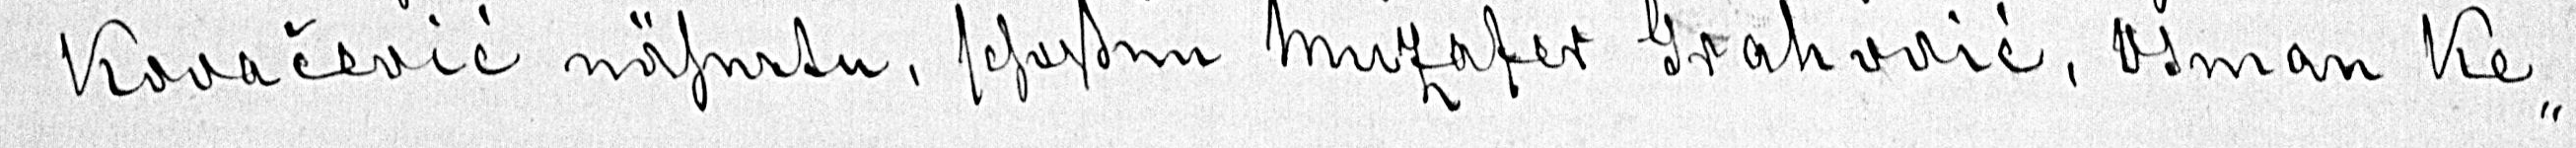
Kovačević näherte, schoßen Muzafer Grahović, Osman Ke¬
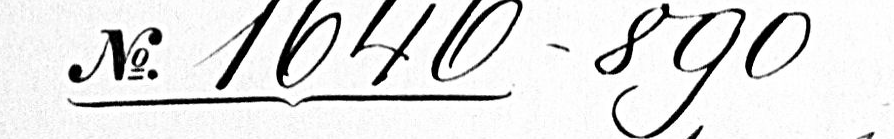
N° 1646-890
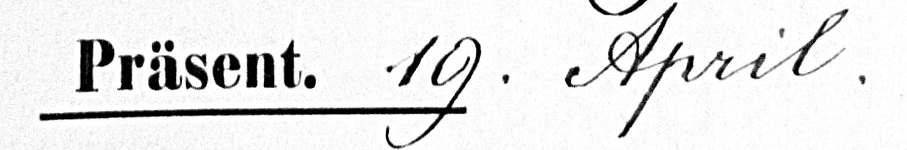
Präsent. 19. April.
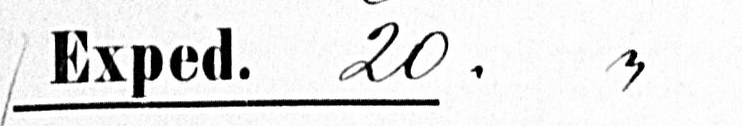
Exped. 20. April.
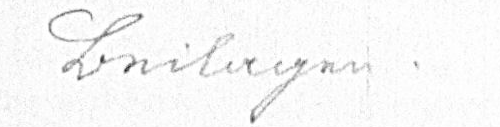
Beilagen.
